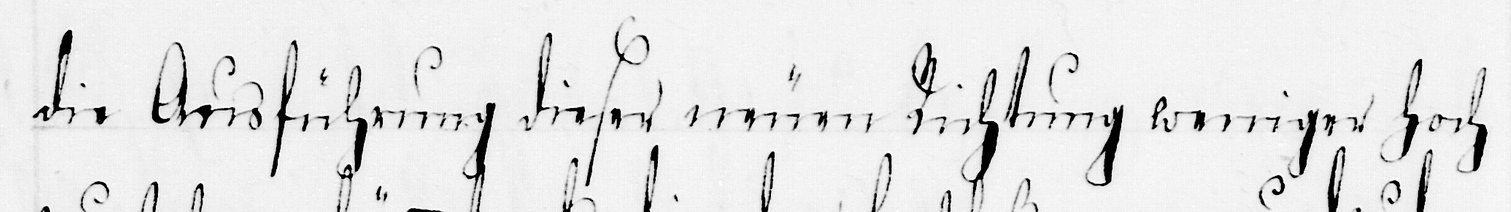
die Ausführung dieser neuen Richtung weniger hoch
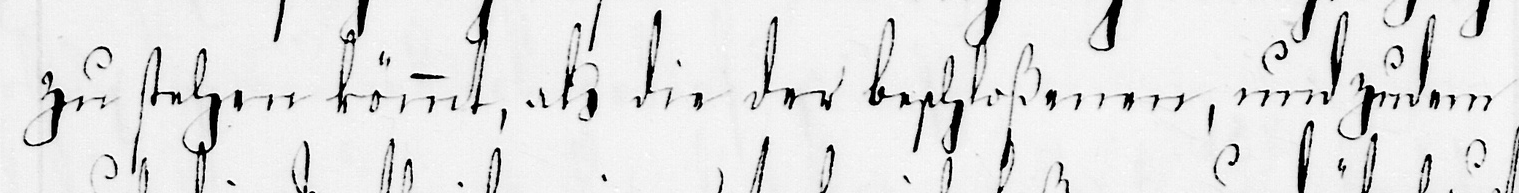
zu stehen kömmt, als die der beschloßenen, und zudem
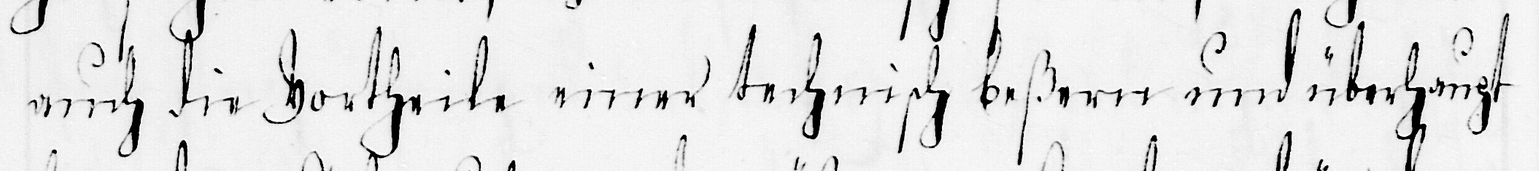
auch die Vortheile einer technisch beßern und überhaupt
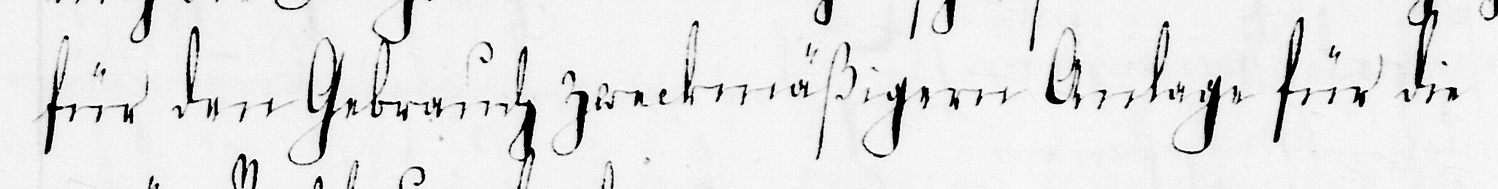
für den Gebrauch zweckmäßigern Anlage für die
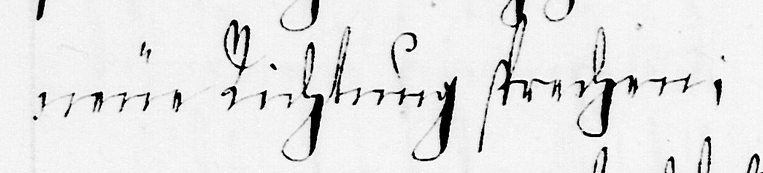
neue Richtung sprechen;
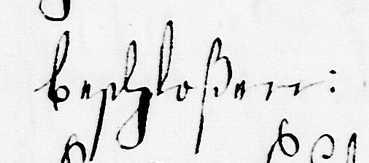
beschloßen:
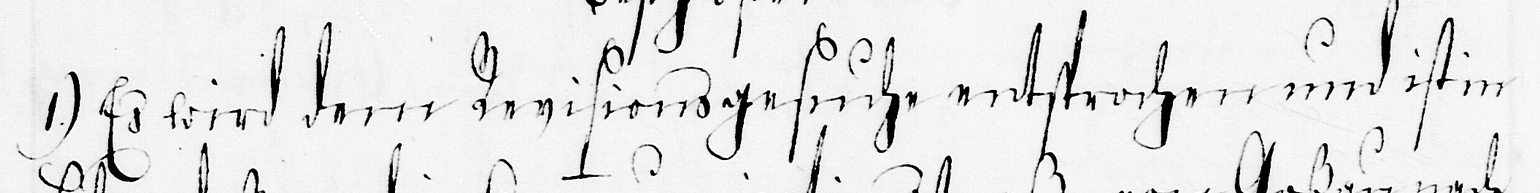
1.) Es wird dem Revisionsgesuche entsprochen und ist in
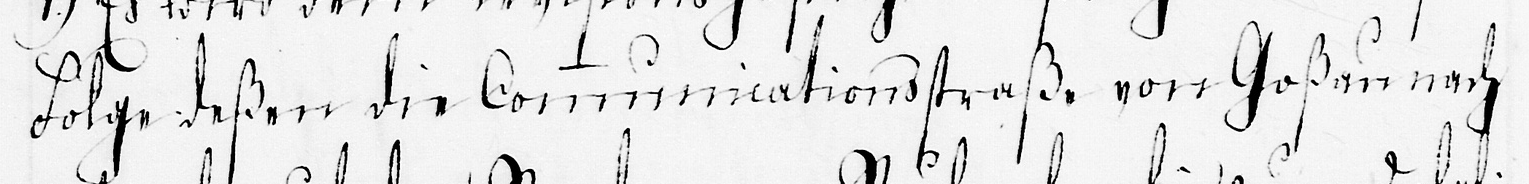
Folge deßen die Communicationsstraße von Goßau nach
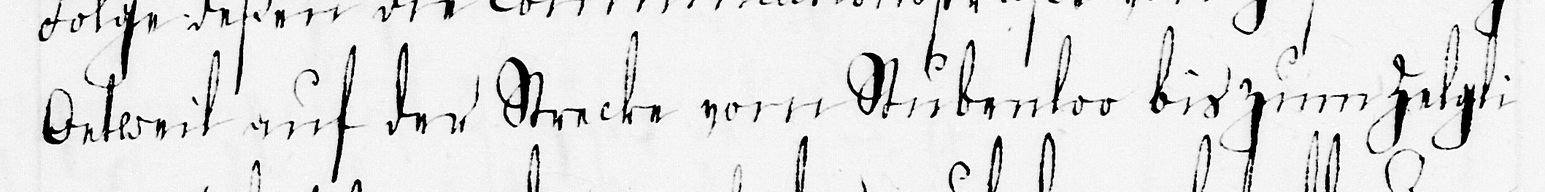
Oetweil auf der Strecke vom Stubenloo bis zum Zelgli
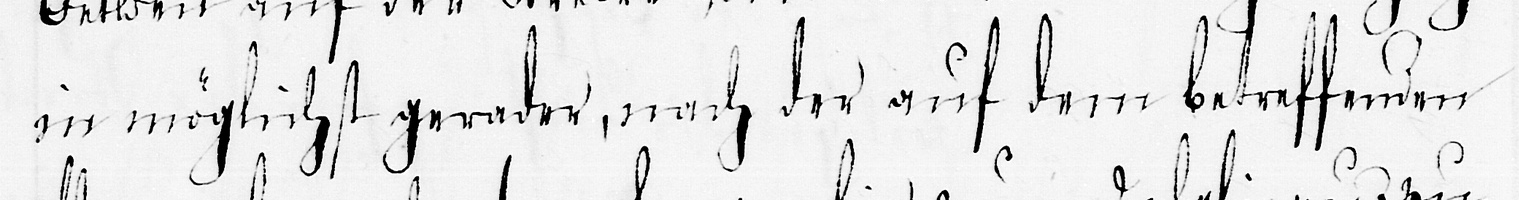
in möglichst gerader, nach der auf dem betreffenden
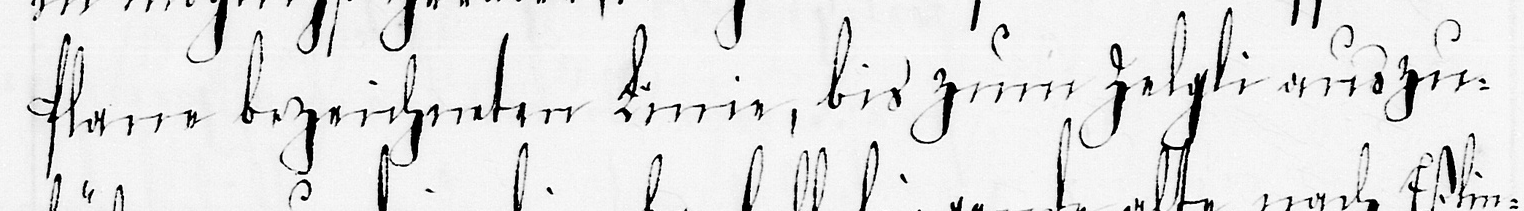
Plane bezeichneten Linie, bis zum Zelgli auszu¬
